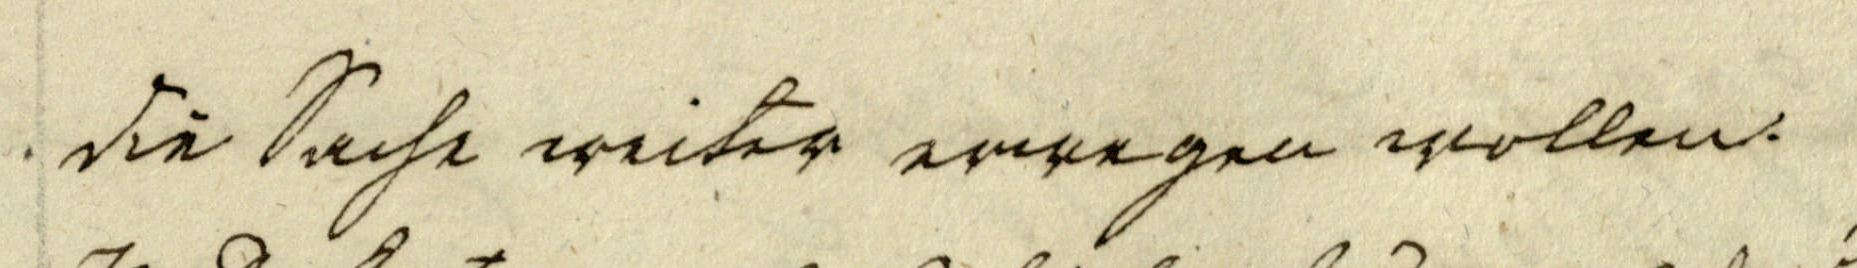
die Sache weiter erwegen wollen.
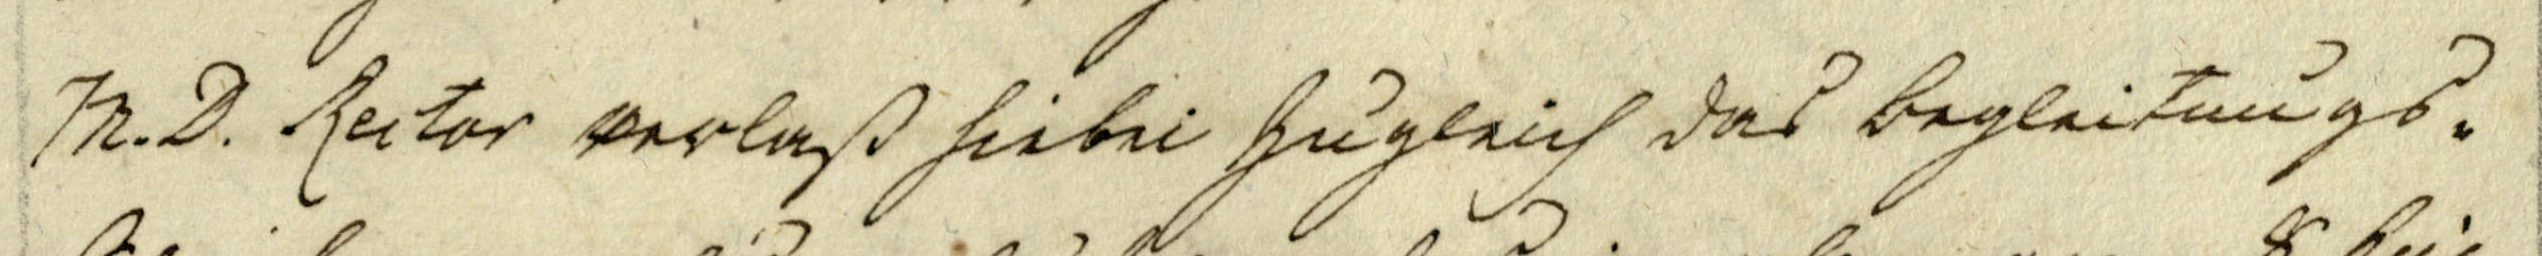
M. D. Rector verlaß hiebei zugleich das Begleitungs¬
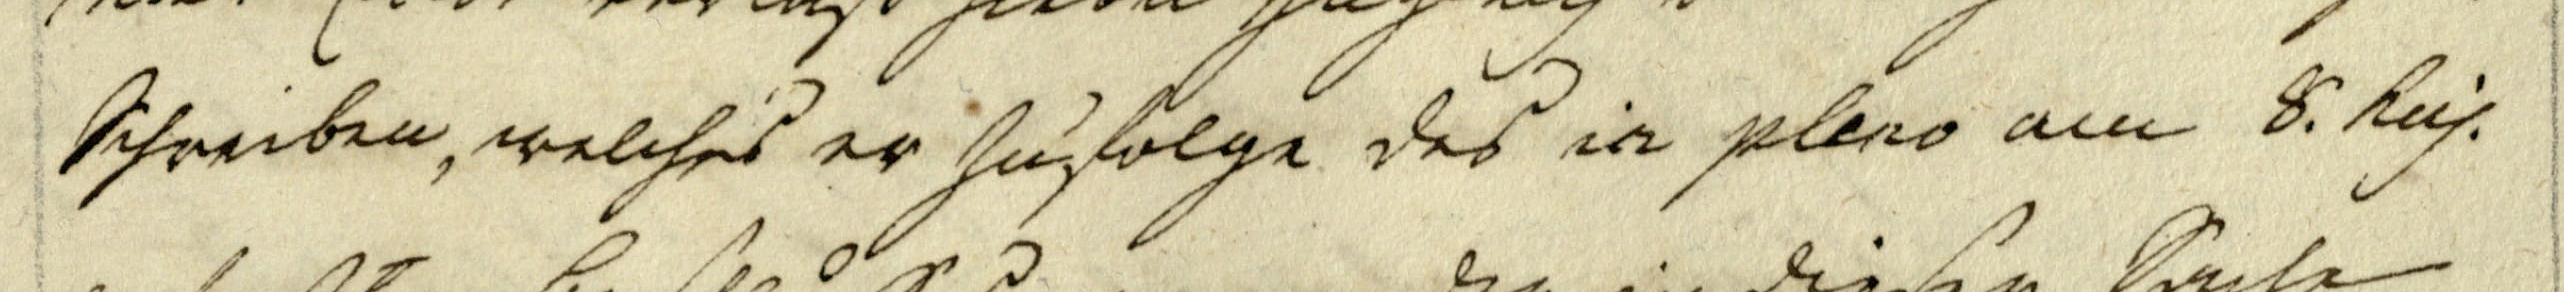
Schreiben, welches er zufolge des in pleno am 8. huj.
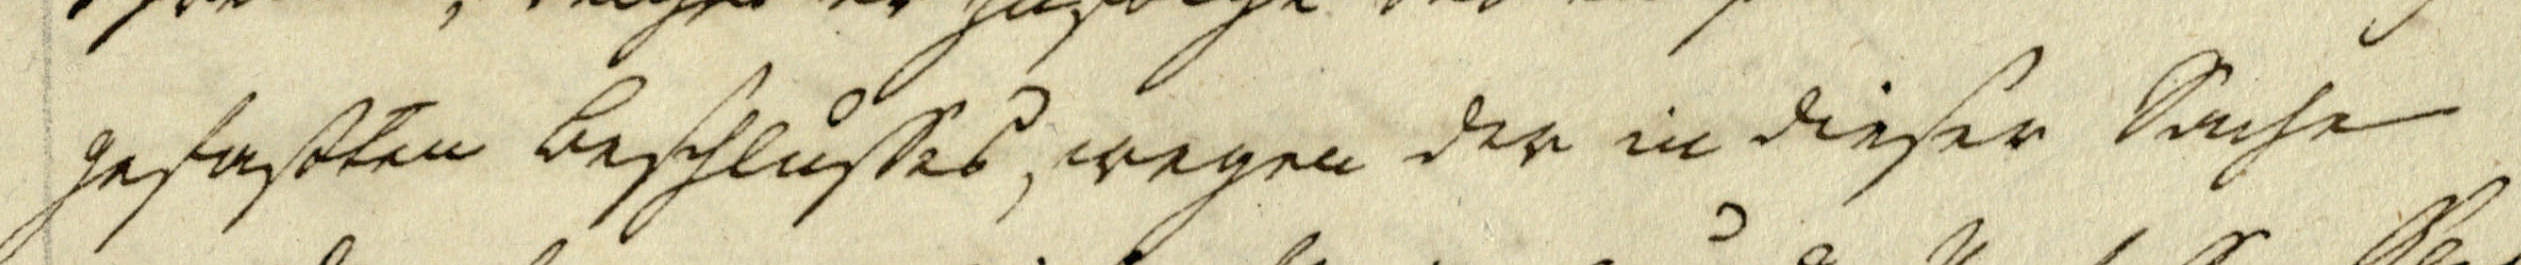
gefaßten Beschlusses, wegen der in dieser Sache
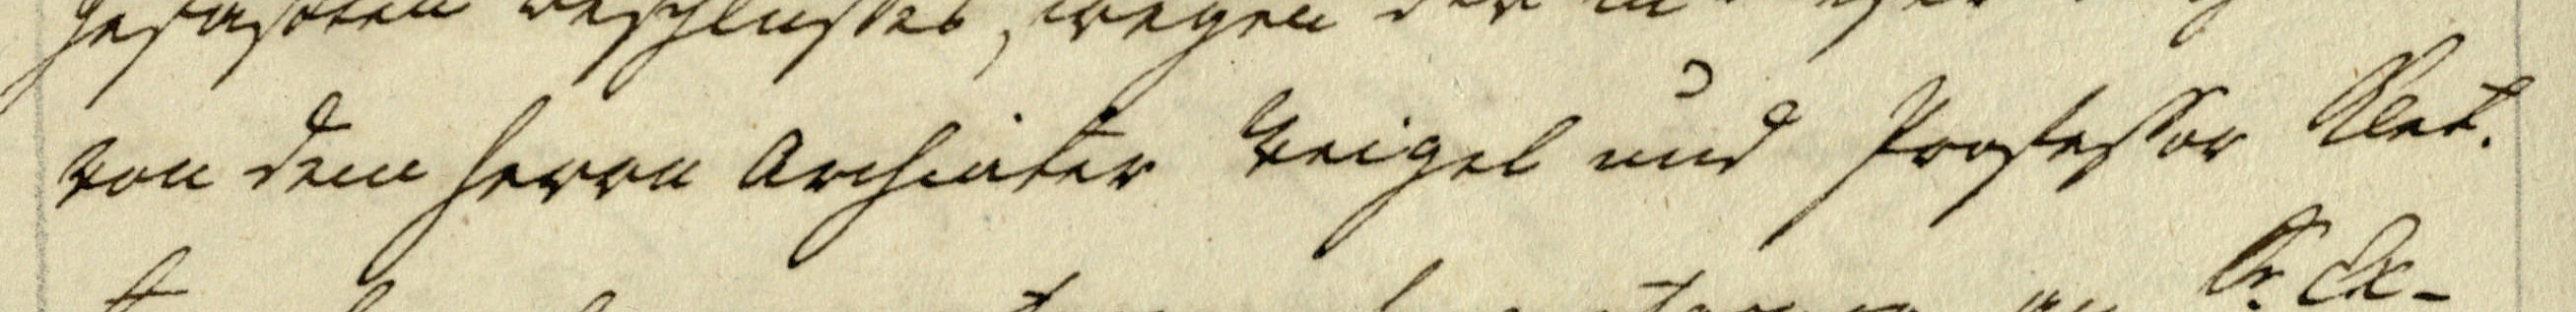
von dem Herrn Archiater Weigel und Professor Klet¬
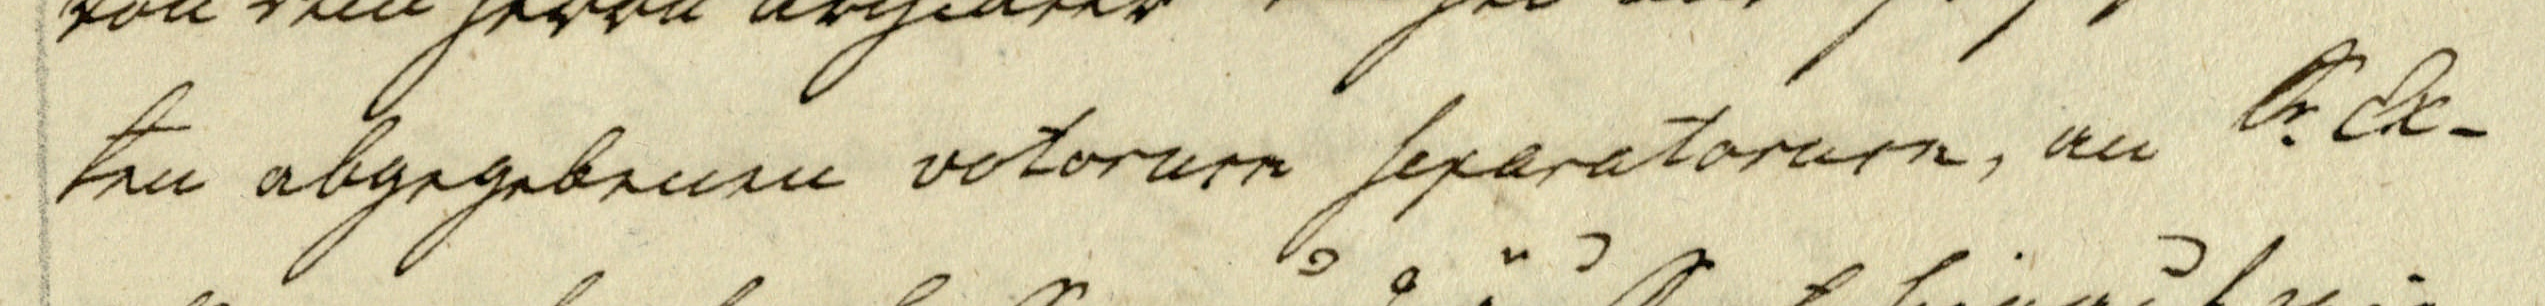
ten abgegebenen votorum separatorum, an Sr Ex¬
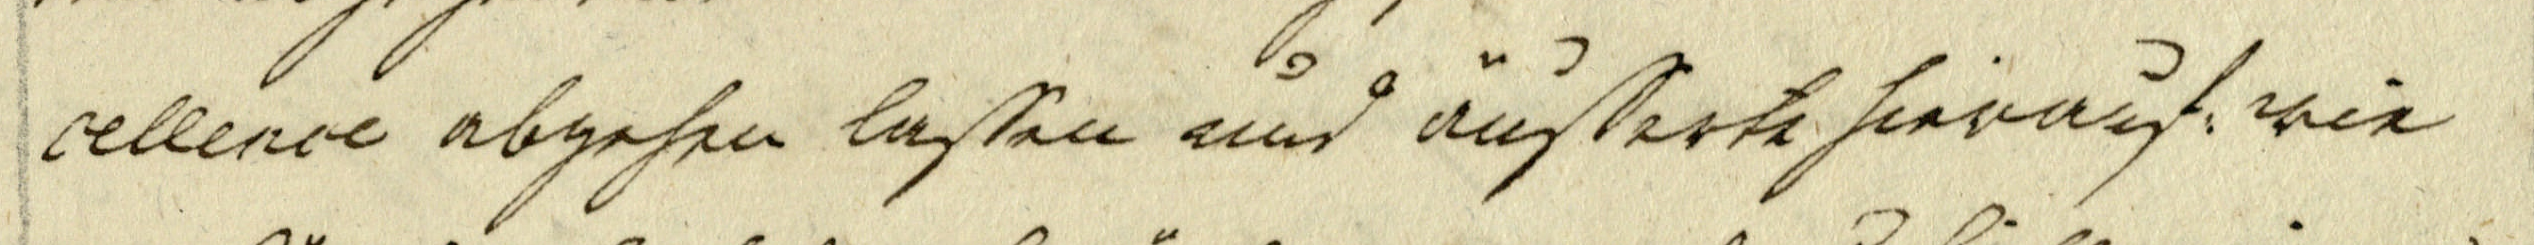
cellence abgehen lassen und äusserte hierauf: wie
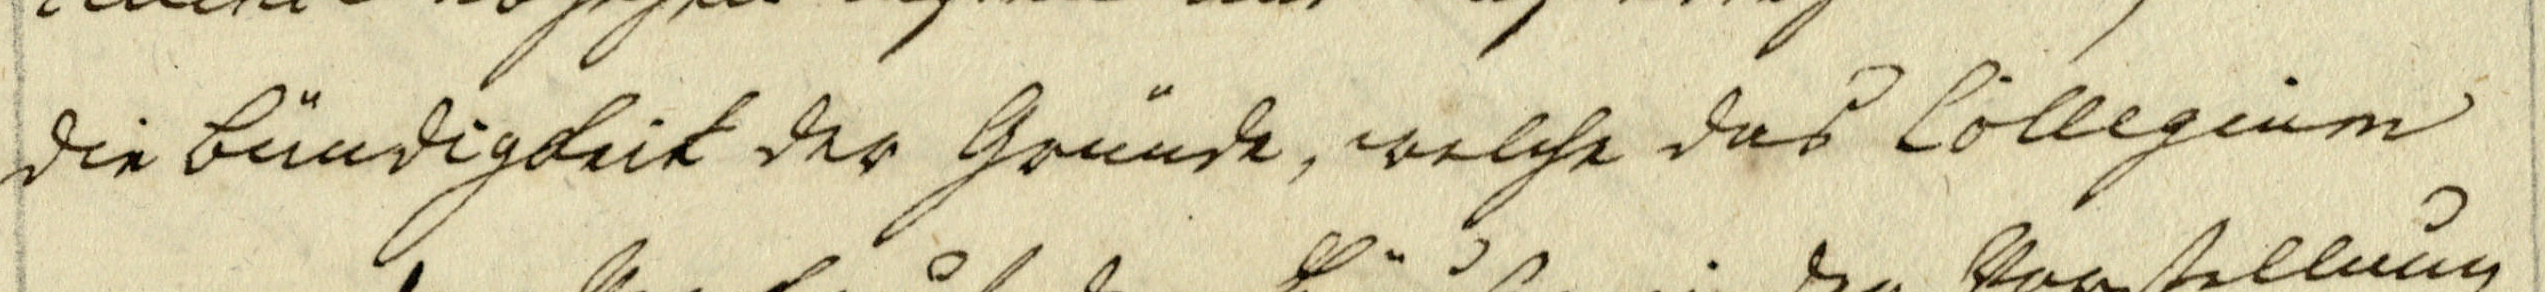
die Bündigkeit der Gründe, welche das Collegium
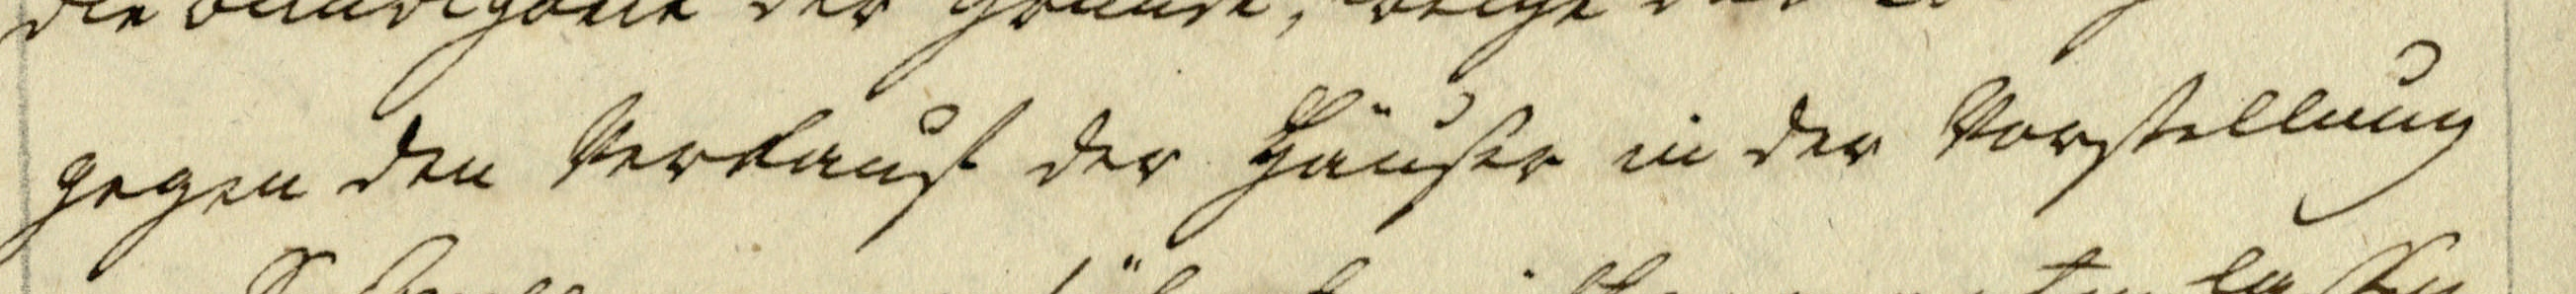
gegen den Verkauf der Häuser in der Vorstellung
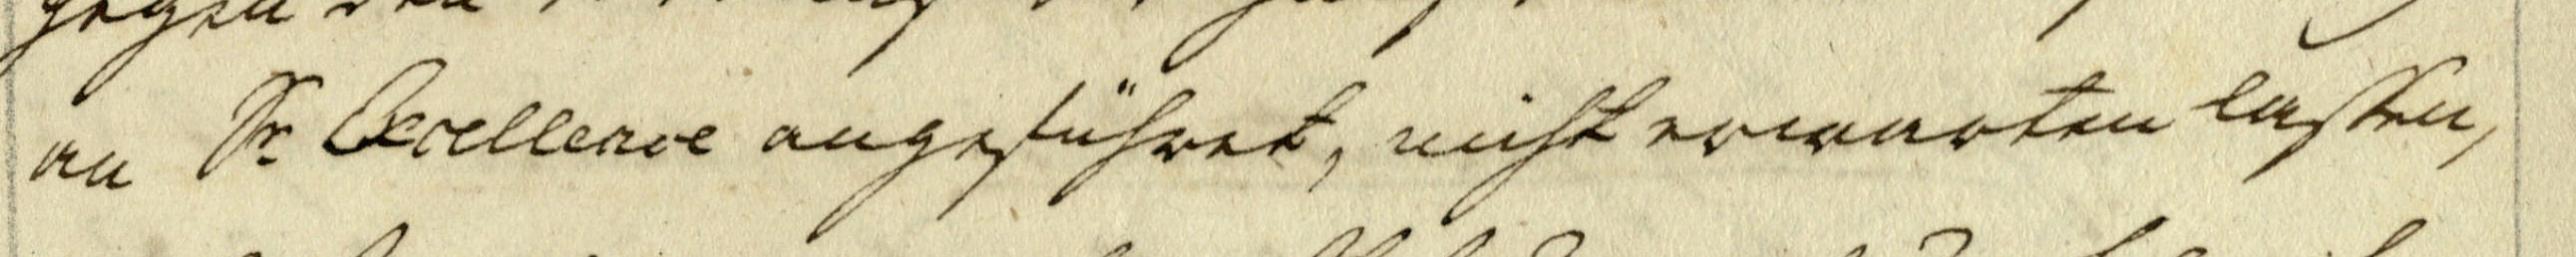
an Sr Excellence angeführet, nicht erwarten lassen,
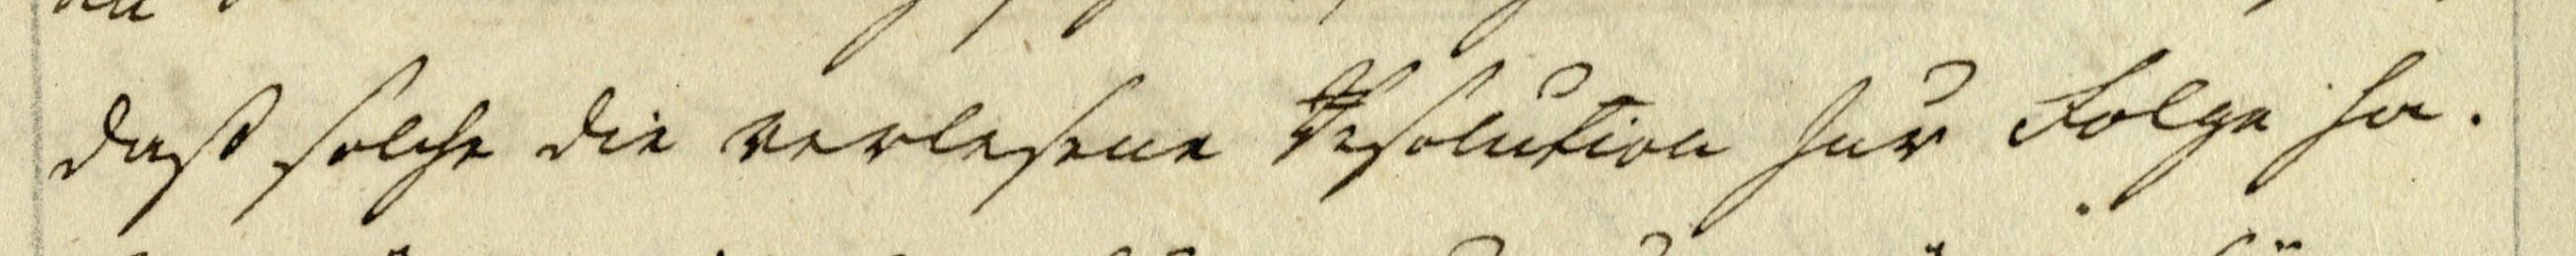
daß solche die verlesene Resolution zur Folge ha¬
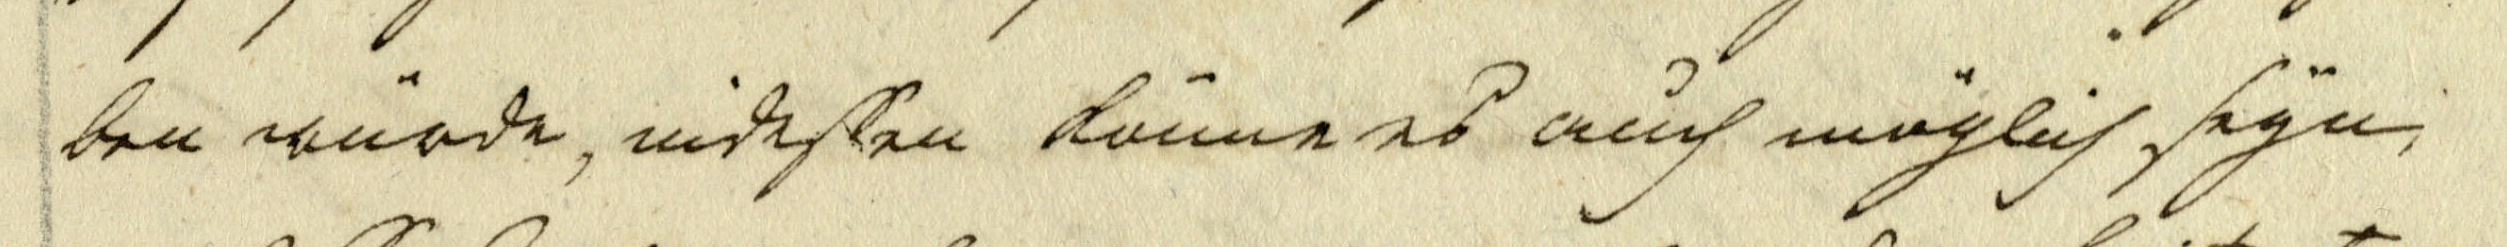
ben würde, indessen könne es auch möglich seÿn,
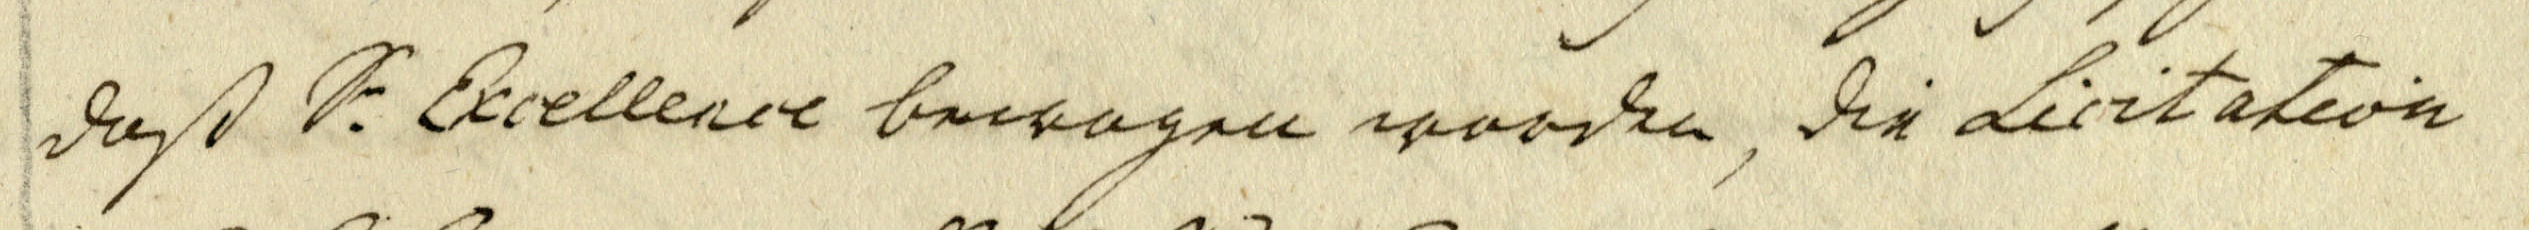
daß Sr. Excellence bewogen worden, die Licitation
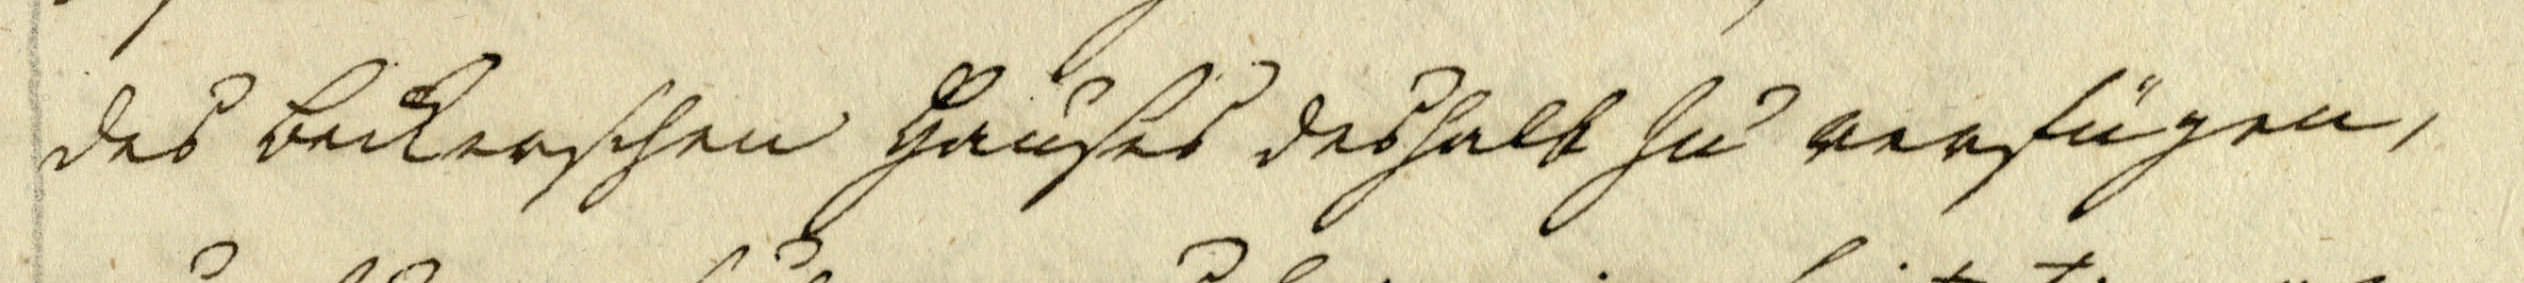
des Beckerschen Hauses deshalb zu verfügen,
